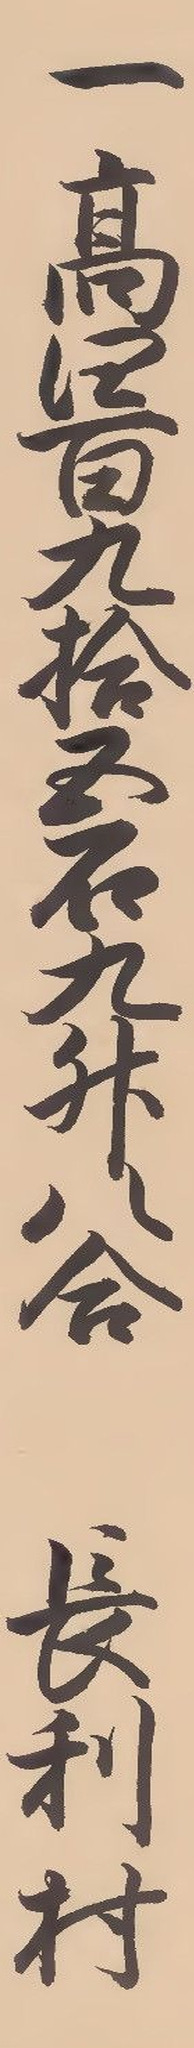一髙四百九拾五石九升八合長利村
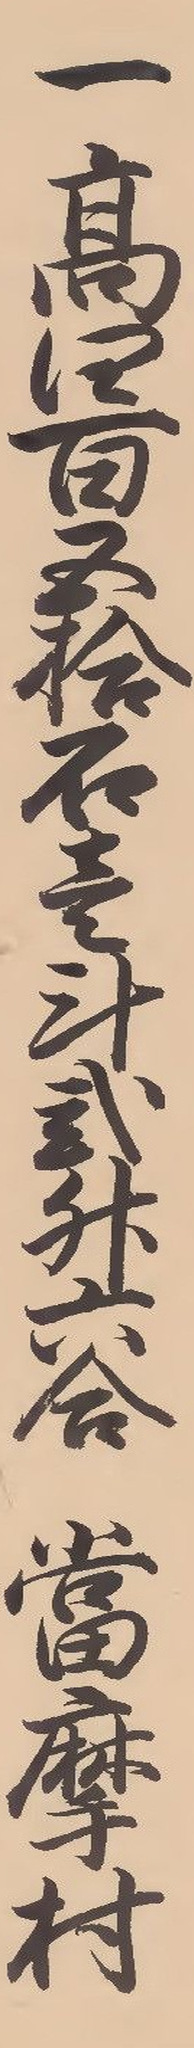一髙四百五拾石壱斗弐升六合當摩村
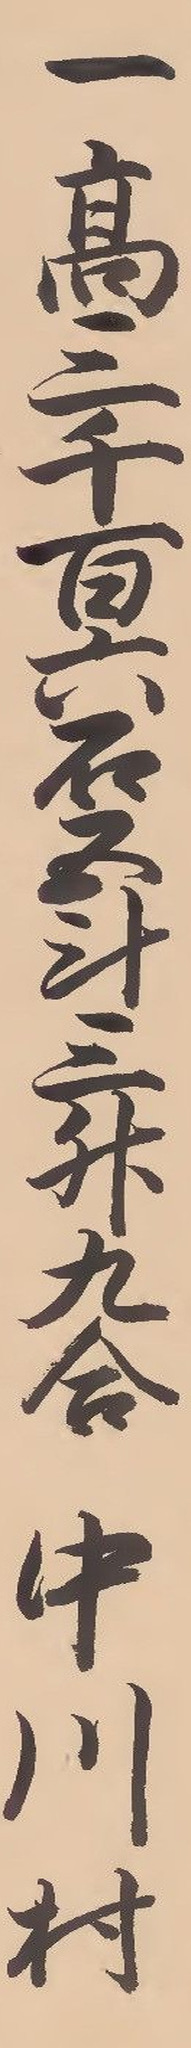一髙三千百六石五斗三升九合中川村
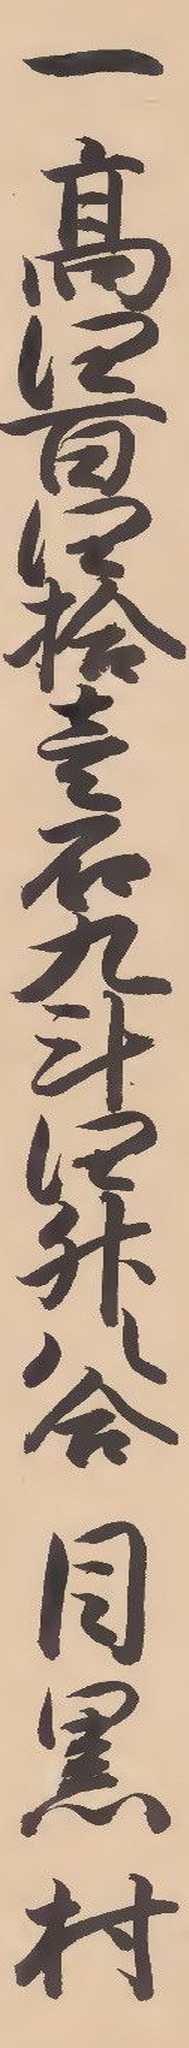一髙四百四拾壱石九斗四升八合目黑村
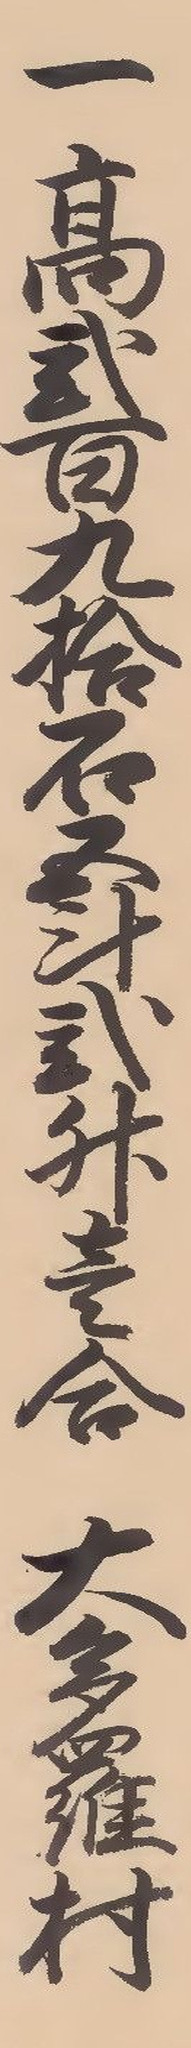一髙弐百九拾石五斗弐升壱合大多羅村
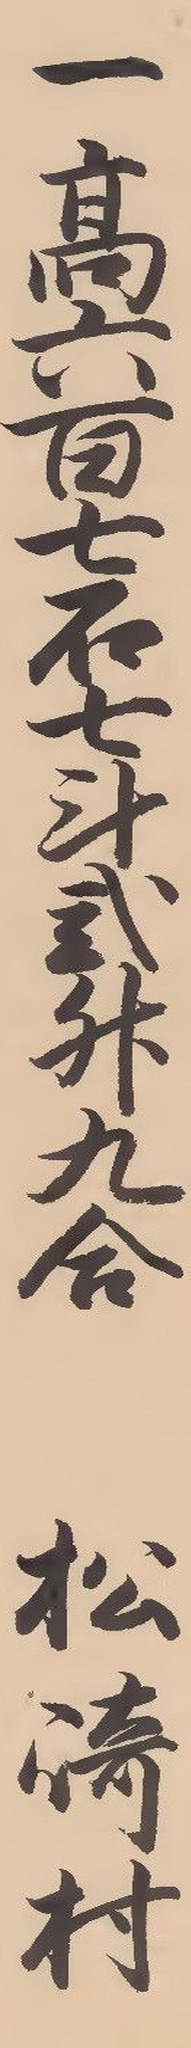一髙六百七石七斗弐升九合松崎村
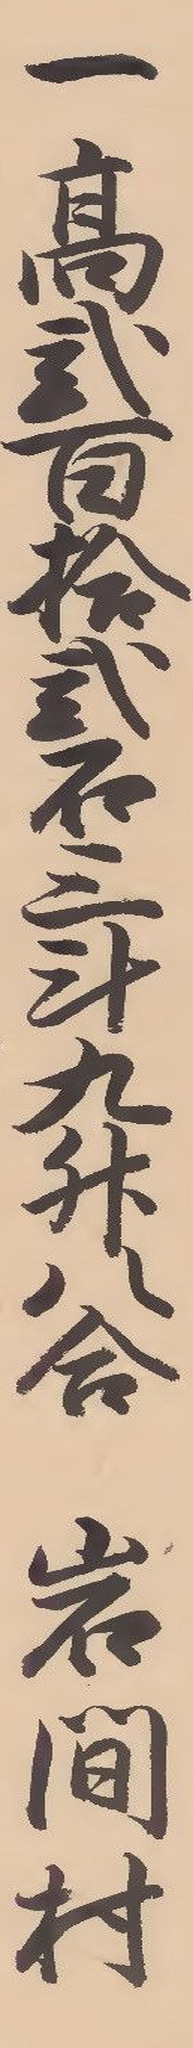一髙弐百拾弐石三斗九升八合岩間村

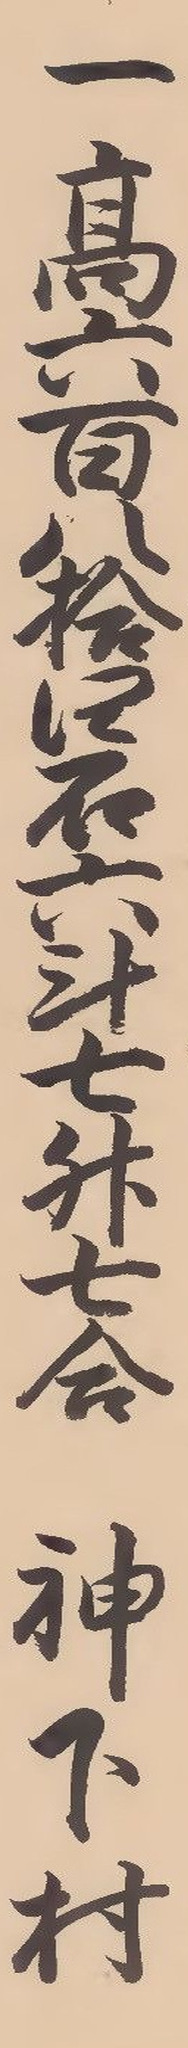一髙六百八拾四石六斗七升七合神下村
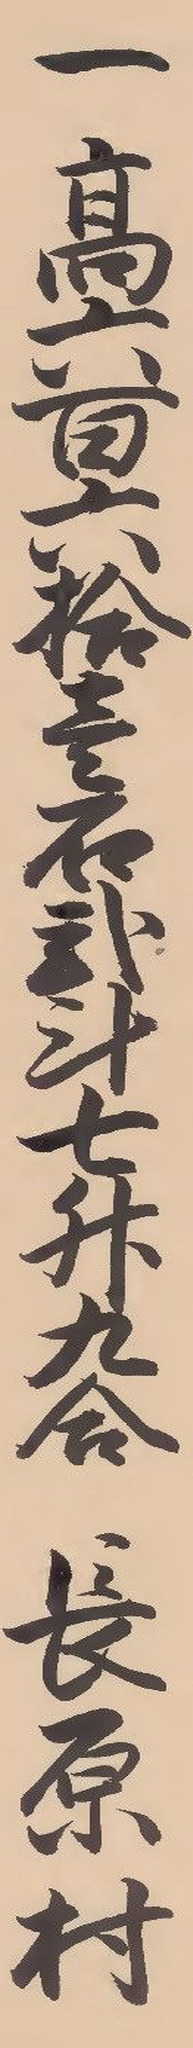一髙六百六拾壱石弐斗七升九合長原村
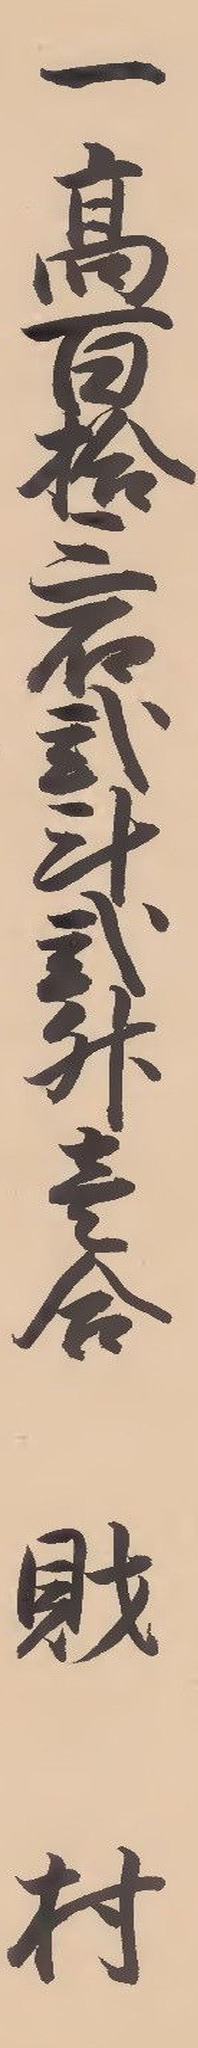一髙百拾三石弐斗弐升壱合財村
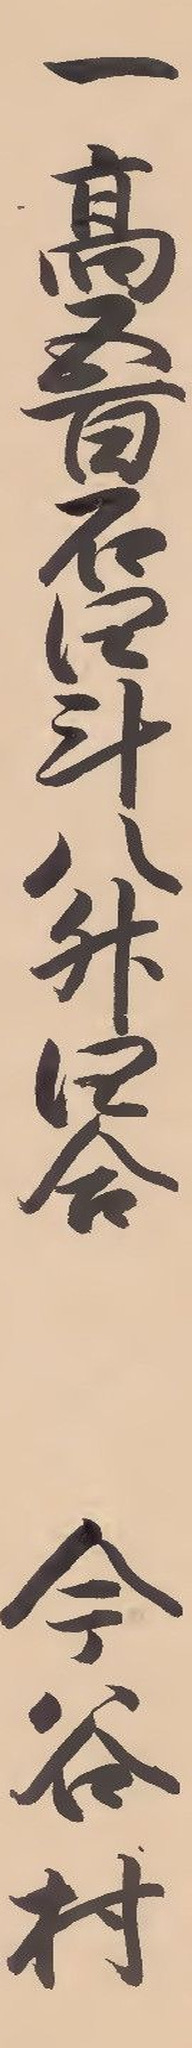一髙五百石四斗八升四合今谷村
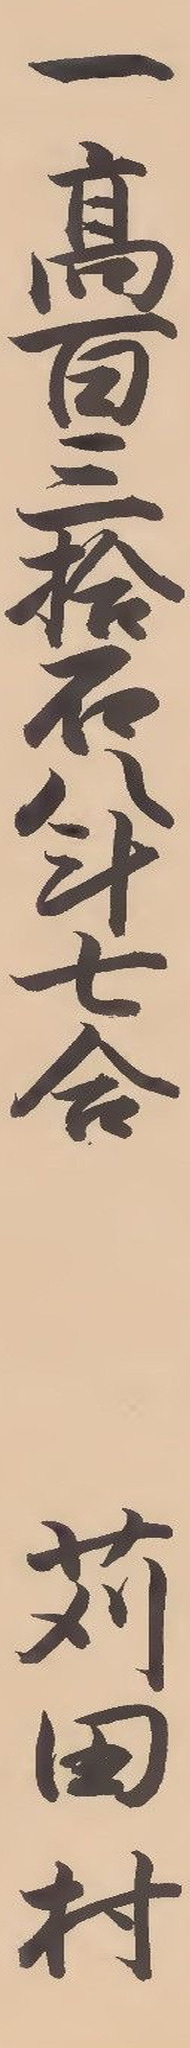一髙百三拾石八斗七合苅田村
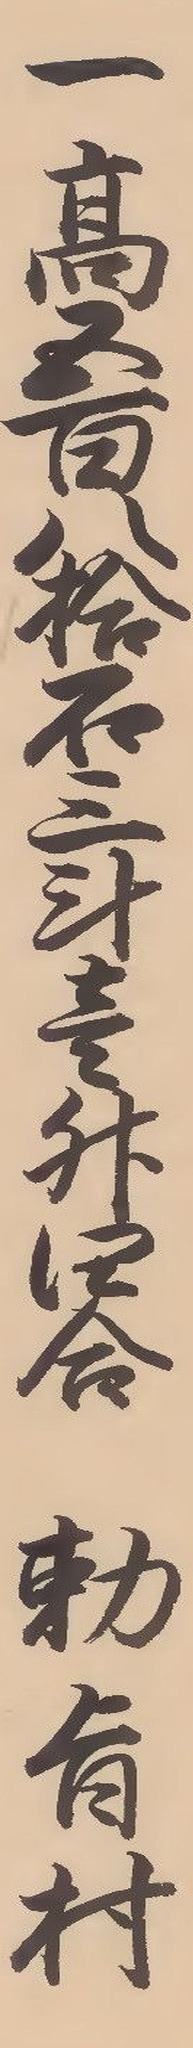一髙五百八拾石三斗壱升四合勅旨村
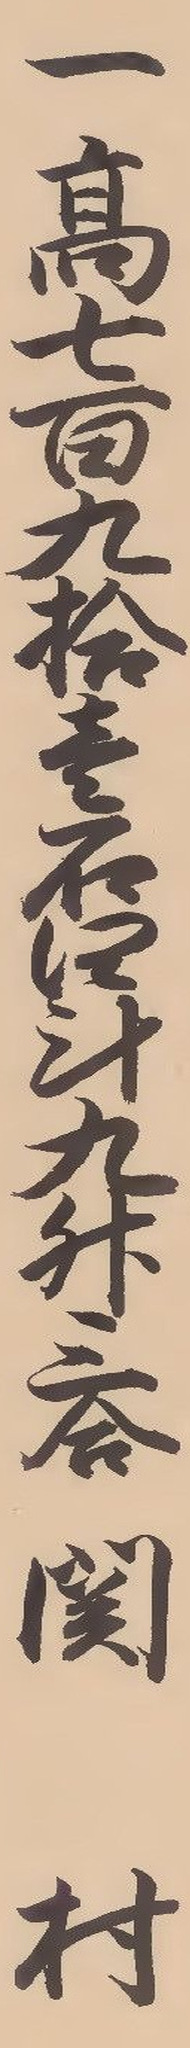一髙七百九拾壱石四斗九升三合関村
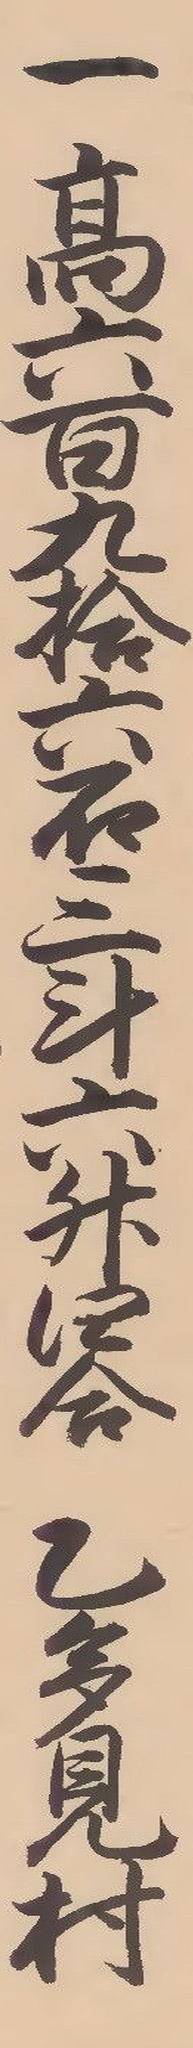一髙六百九拾六石三斗六升四合乙多見村

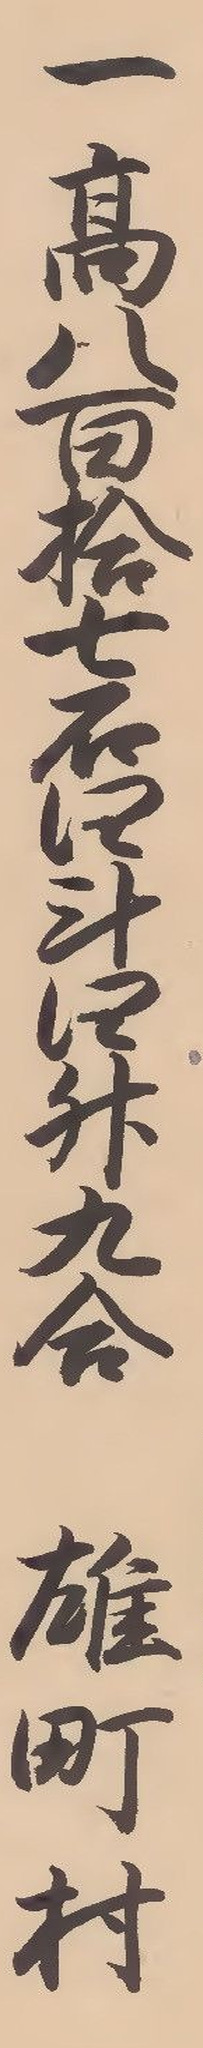一髙八百拾七石四斗四升九合雄町村
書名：備前国郷帳
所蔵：国立公文書館 National Archives of Japan
